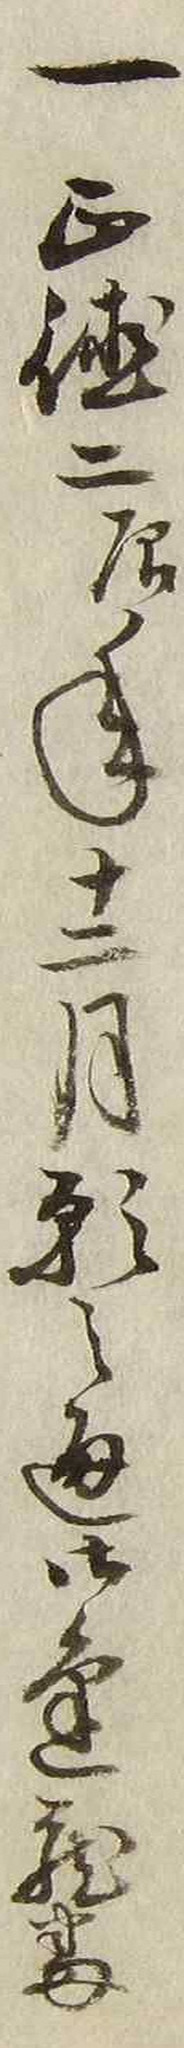一正徳二辰年十二月願之通御金蔵番
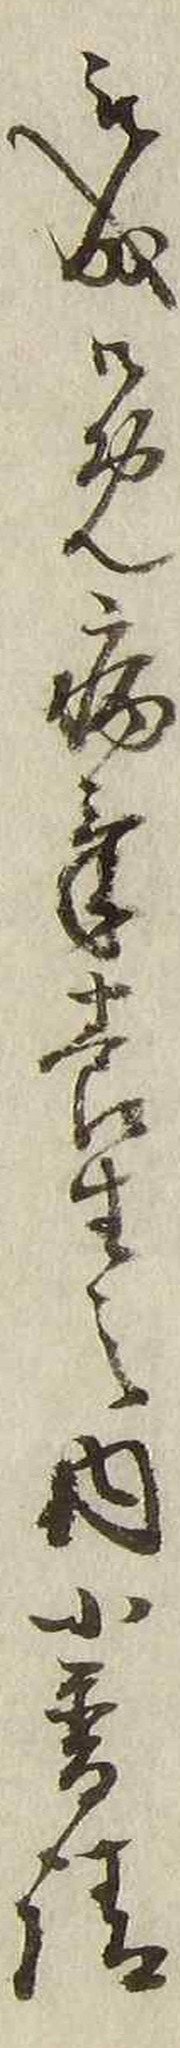被成御免病気養生之内小普請
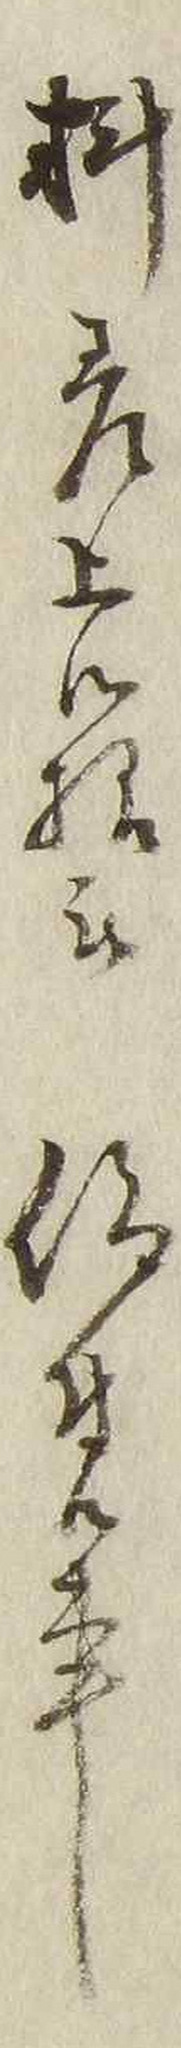料差上候様被仰付候事

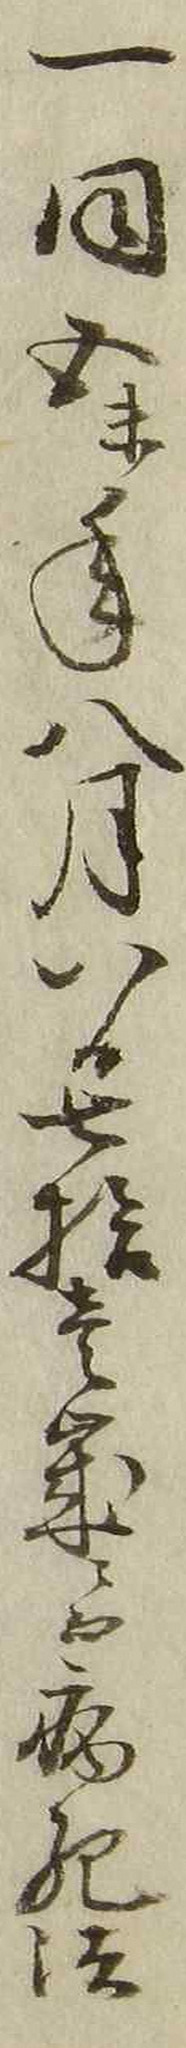一同五未年八月八日七拾壱歳ニ而病死法
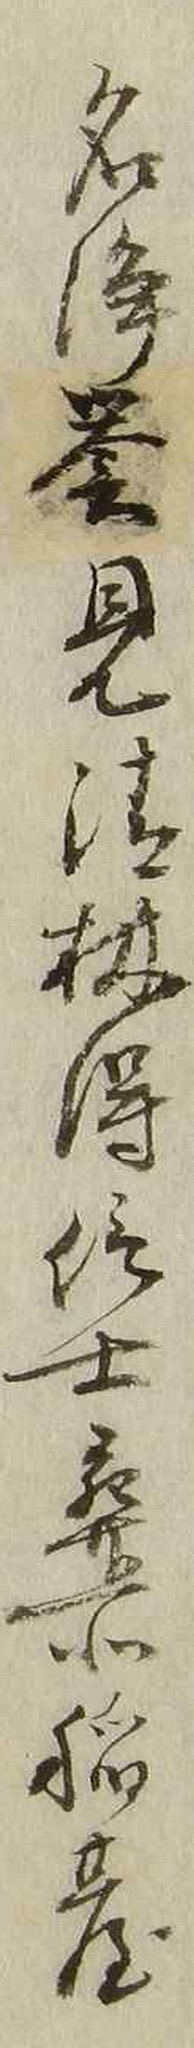名浄誉見清林得信士葬所稲台
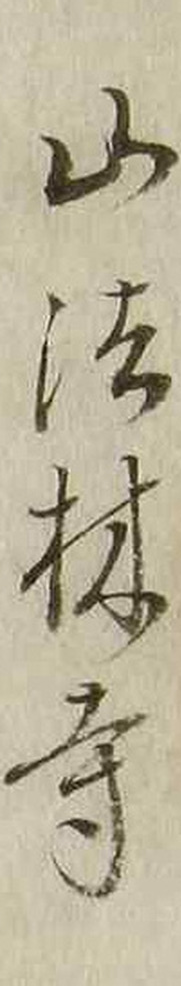山法林寺
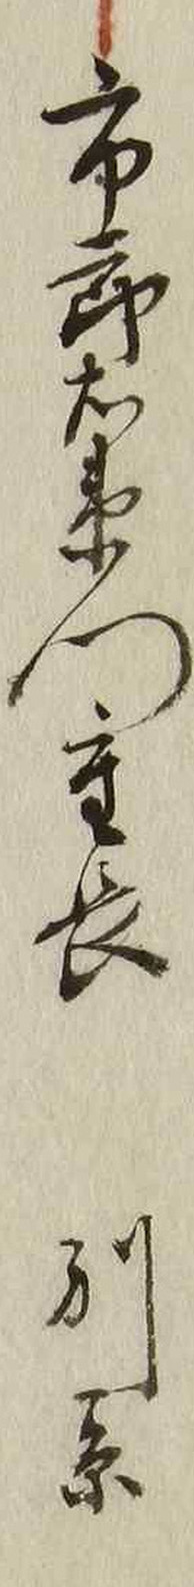市郎右衛門重長別系
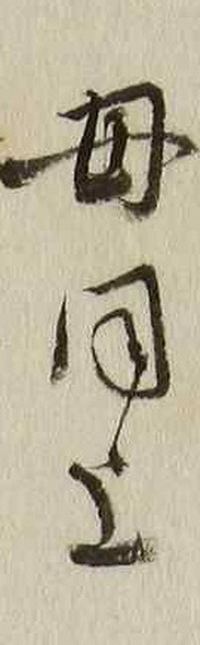母同上
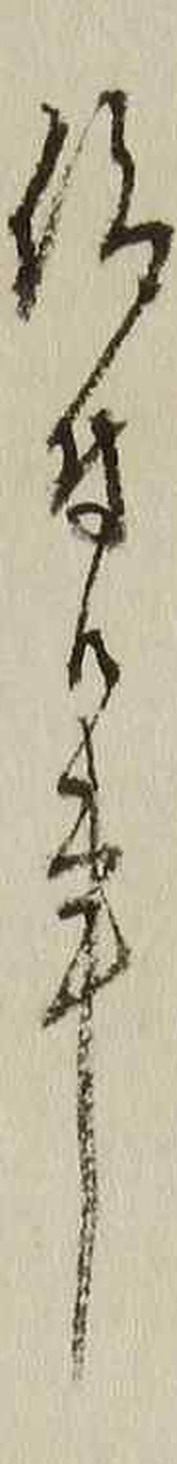仰付候事
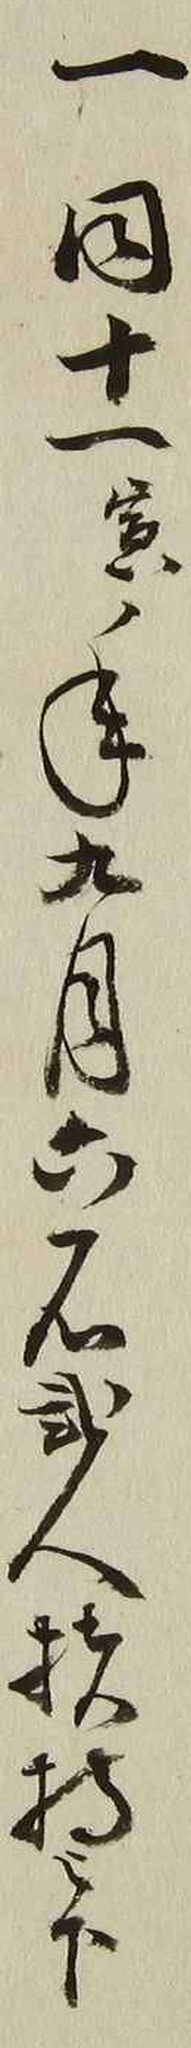一同十一寅年九月六石弐人扶持被下
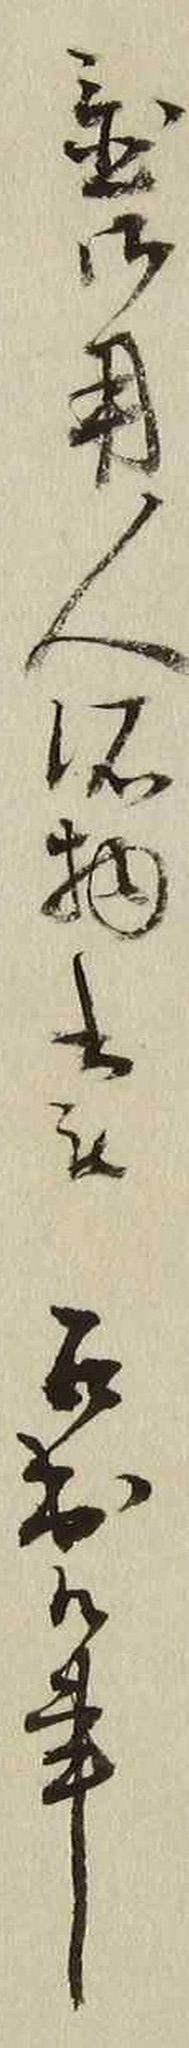置御用人所物書被召出候事
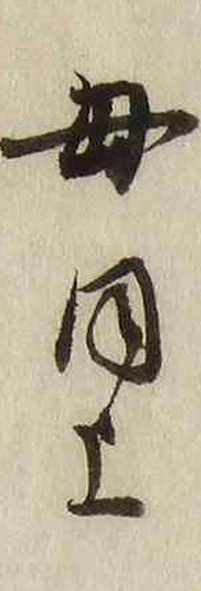母同上
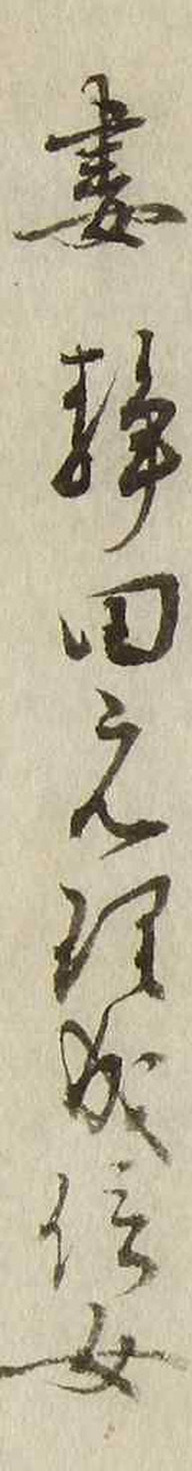妻静田元理成信女
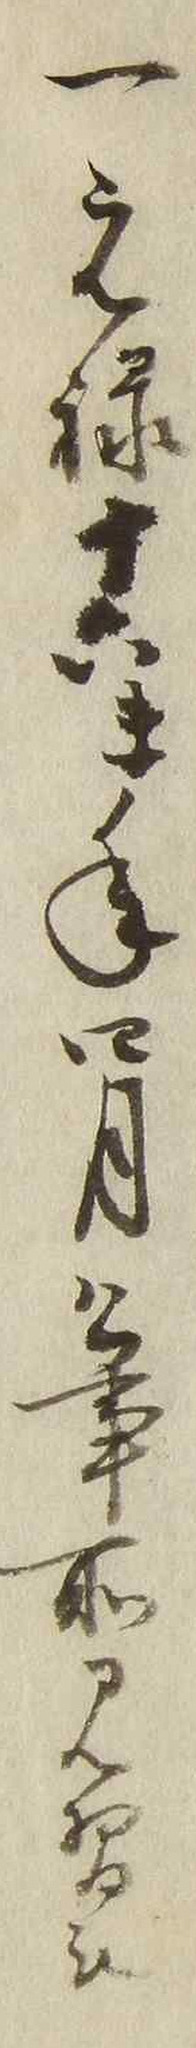一元様十六未年四月公事所見習被

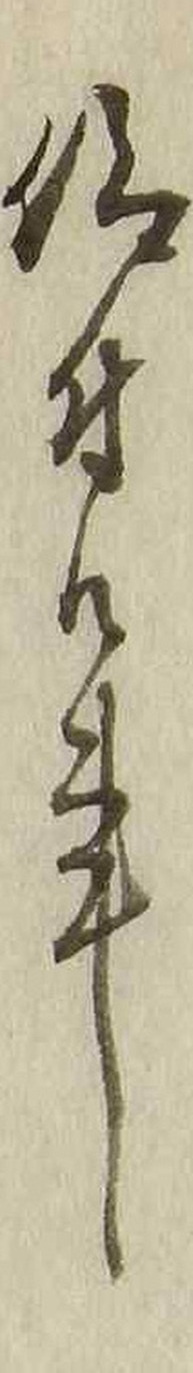仰付候事
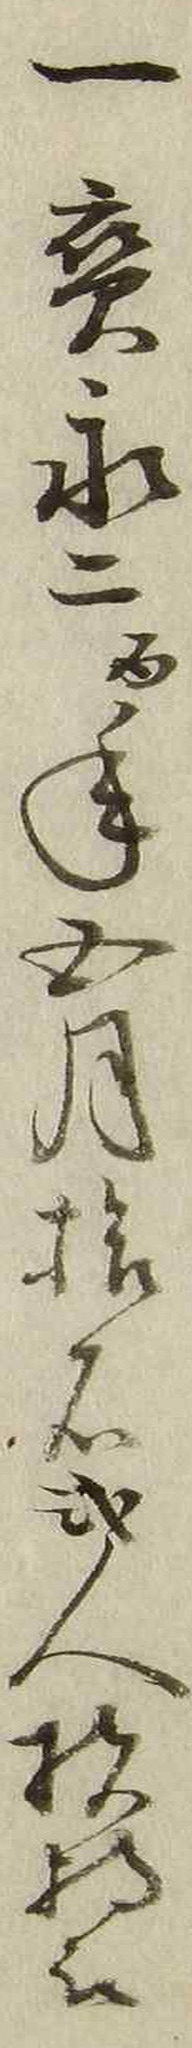一宝永二酉年五月拾石弐人扶持被
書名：諸士系譜　巻之39　は之部7
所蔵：会津若松市立会津図書館
